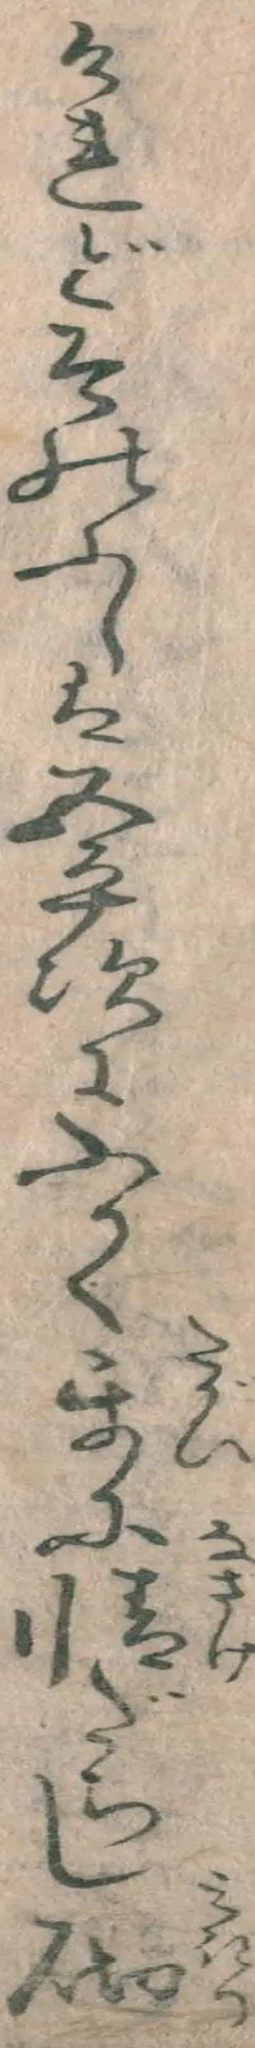けれどそのふしは五平次にふかく互に情だちし砌
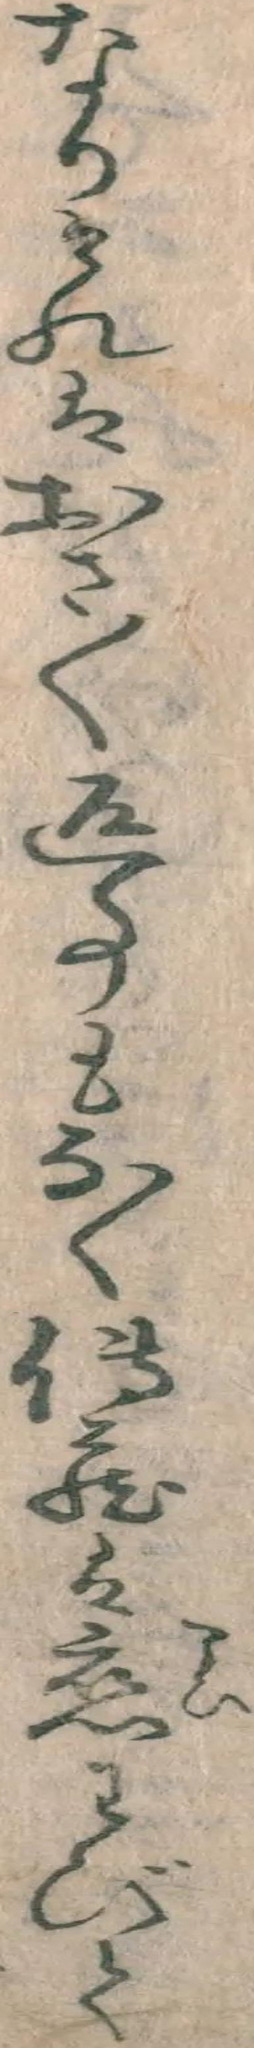なりけれはおさ〳〵返事もなく伝蔵は恋わびて
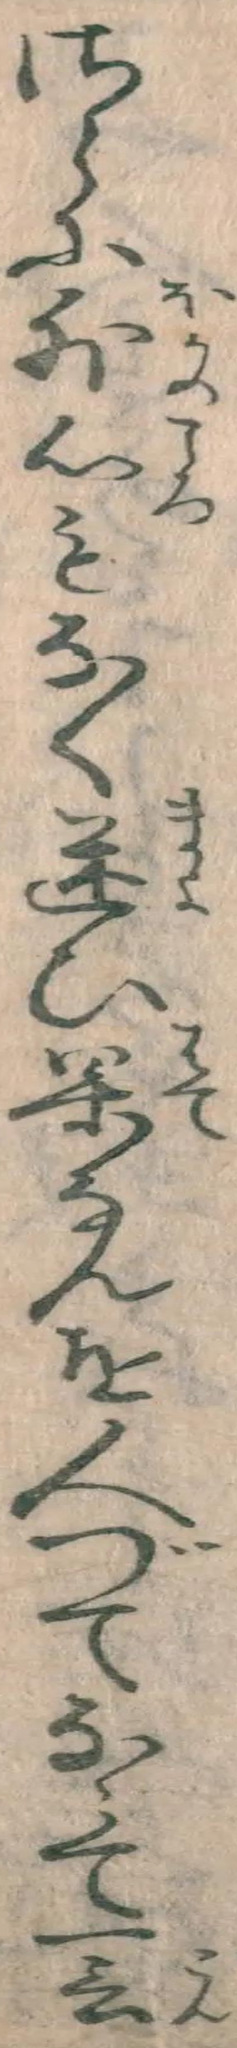さらに外心もなく迷ひ果なんを人づてならて一言
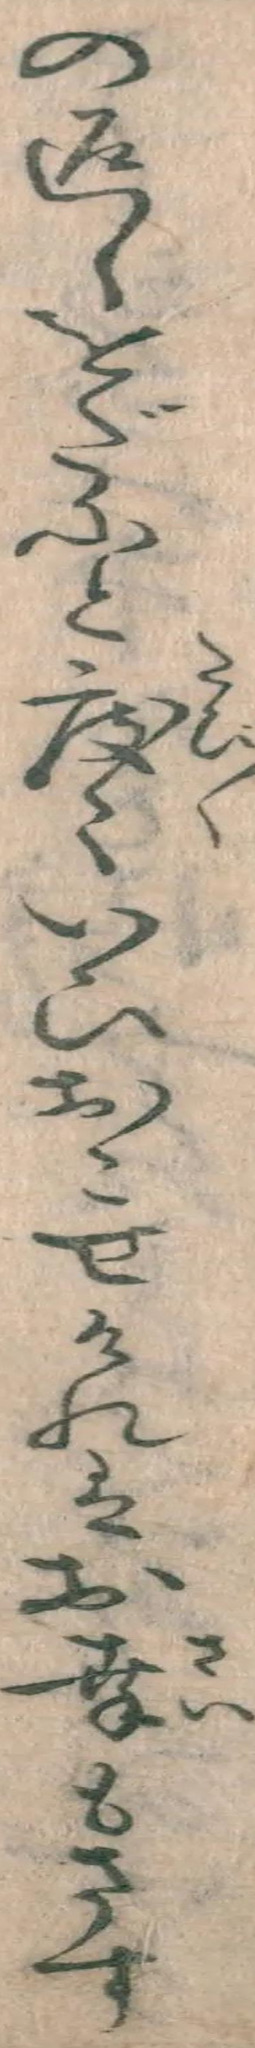の返しをだにと度々いひおこせけれはお幸もさす
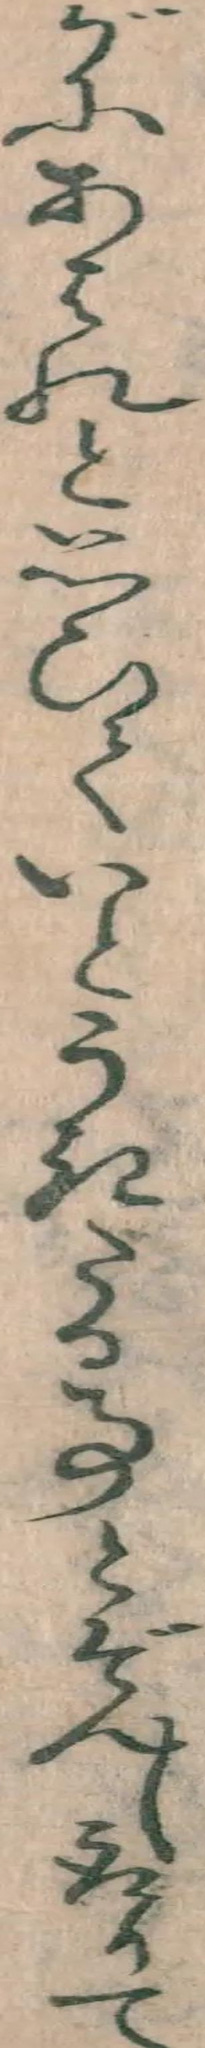がにあはれと思ひていとうきたる事とぞんし取りて
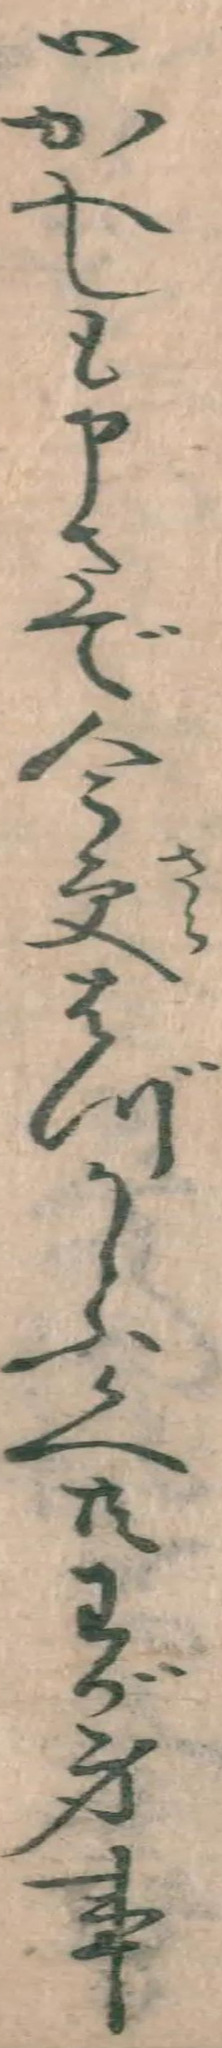御かへしも申さで今更はづかしふ候へ共わが身事
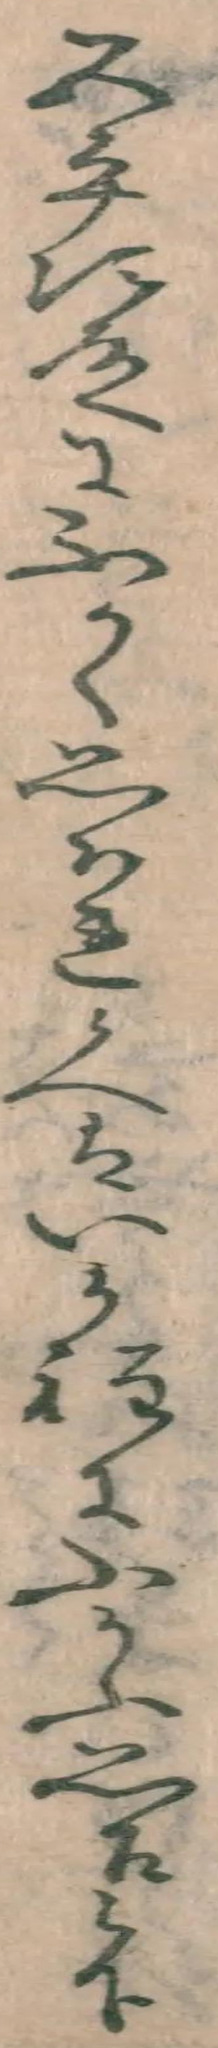五平次殿にふかく思はれ候へはいか程にふかふ思召被下
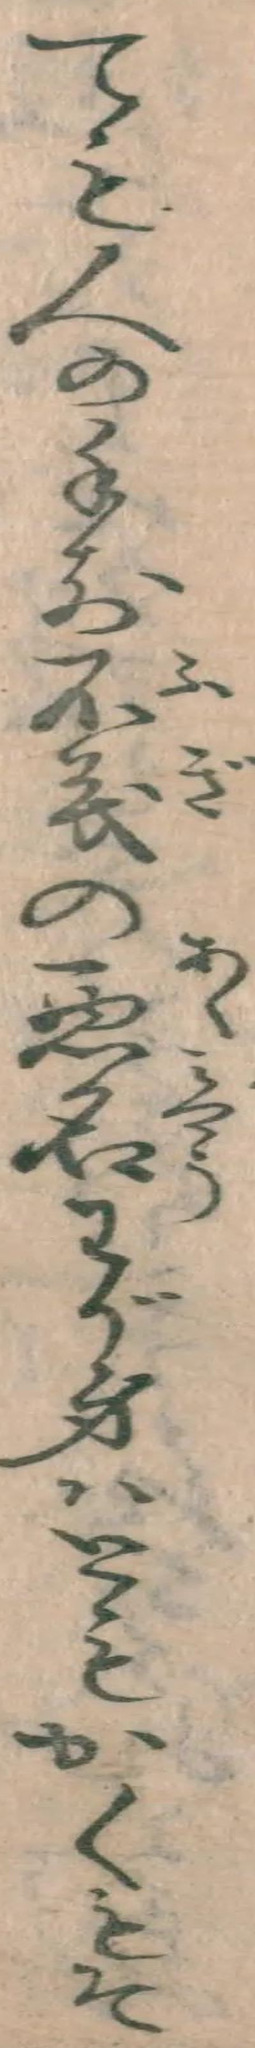ても人の手前不義の悪名わが身はともかくもそ
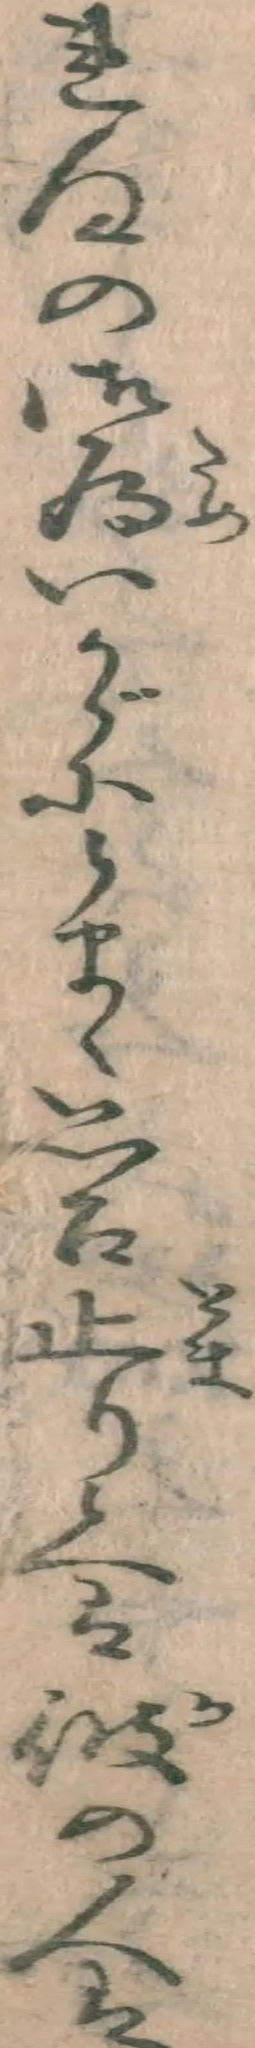れさまの御為いかゞに候まゝ思召止り候へは彼の人は
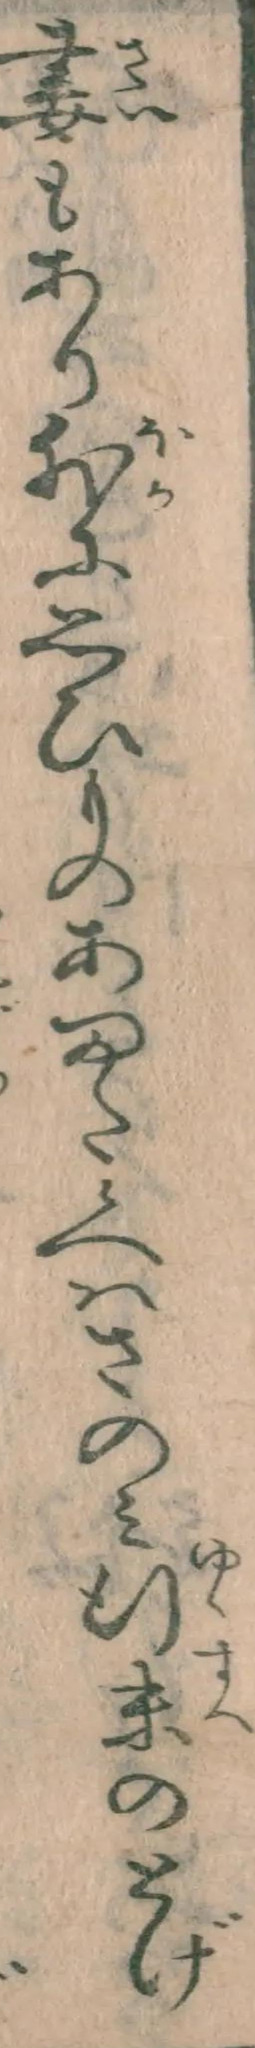妻もあり外に思ひものあまた候へはさのみ行末のとげ
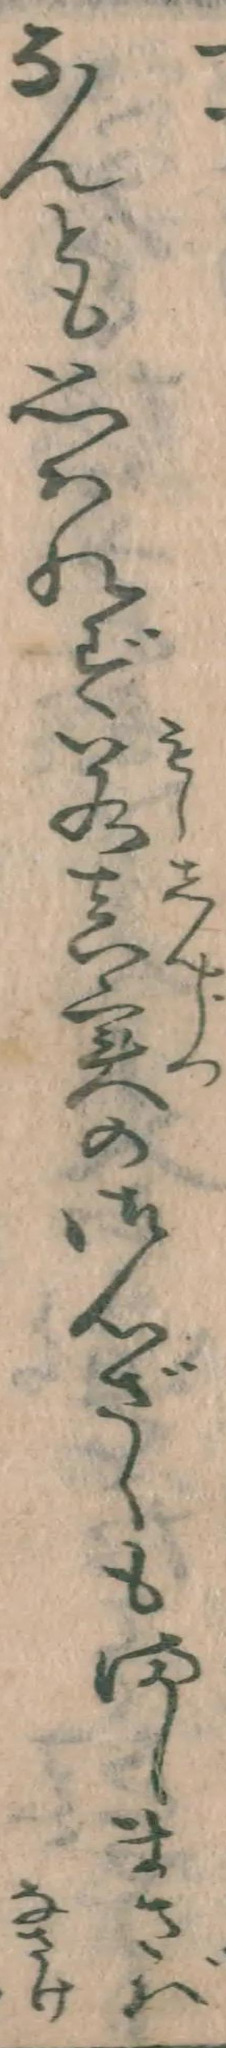なんとも思はれず若真実の御心ざしもましまさば
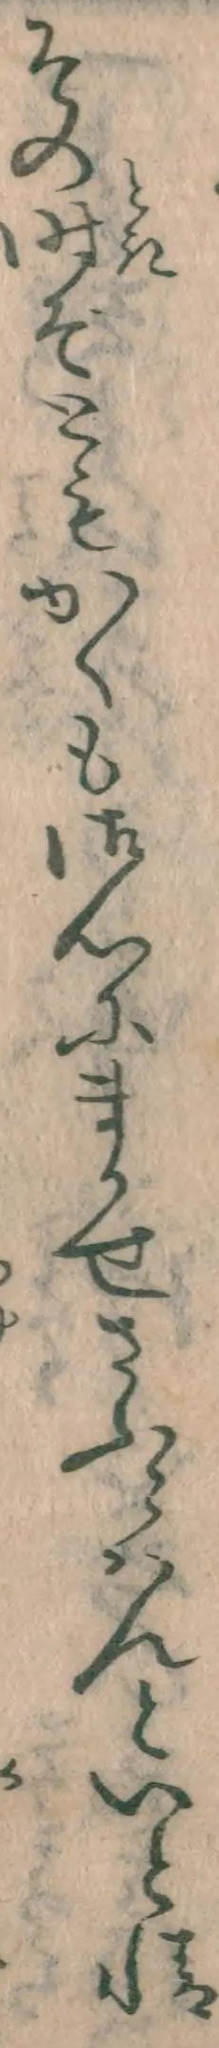その時ぞともかくも御心にまかせさふらはんといと情
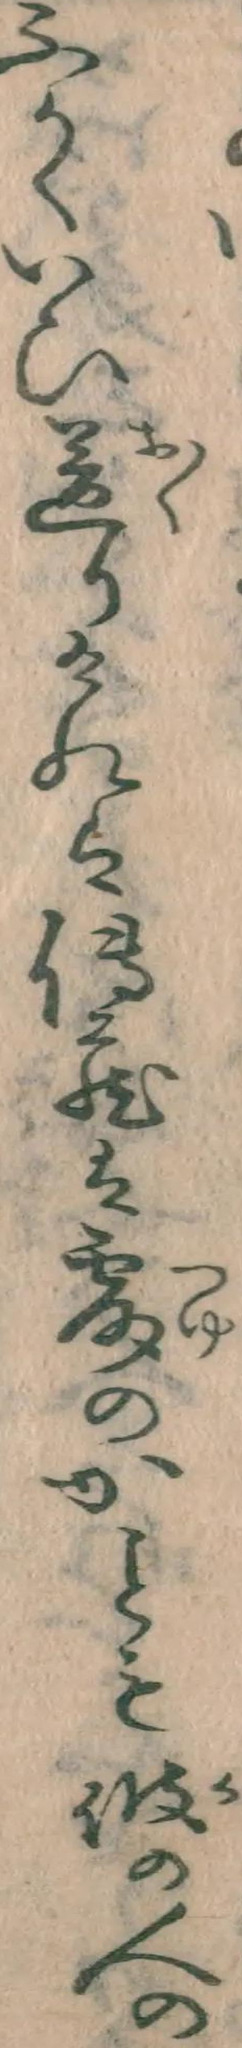ふかくいひ送りけれは伝蔵は露のかことも彼の人の
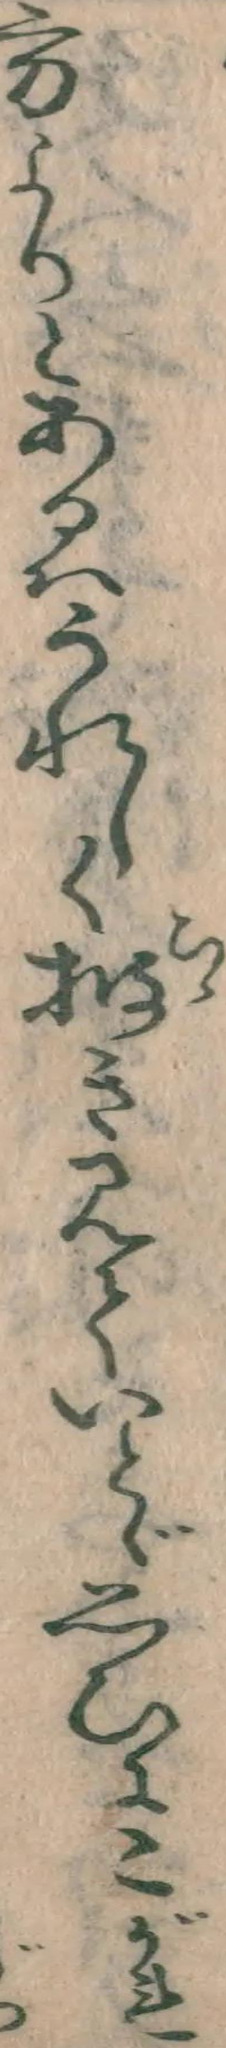方よりとあるはうれしく披き見ていとゞ思ひにこがれ
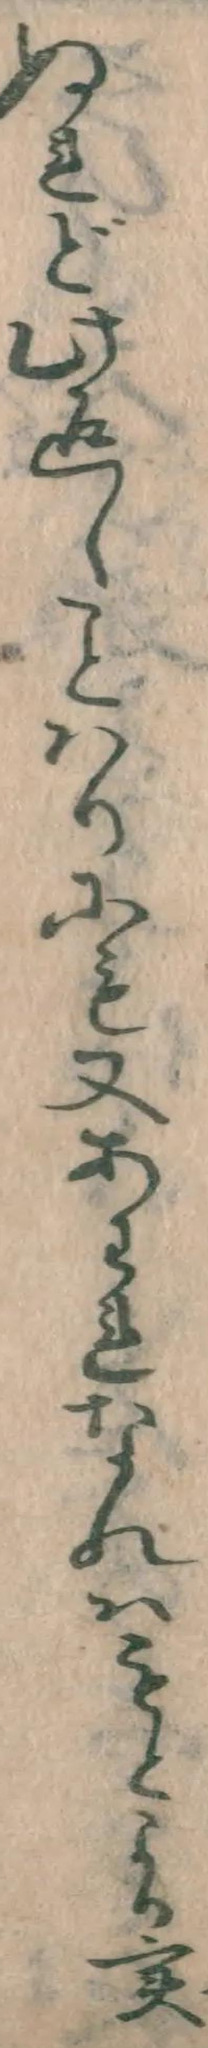ぬれど此返しことはりにも又あわれなれはもとより実
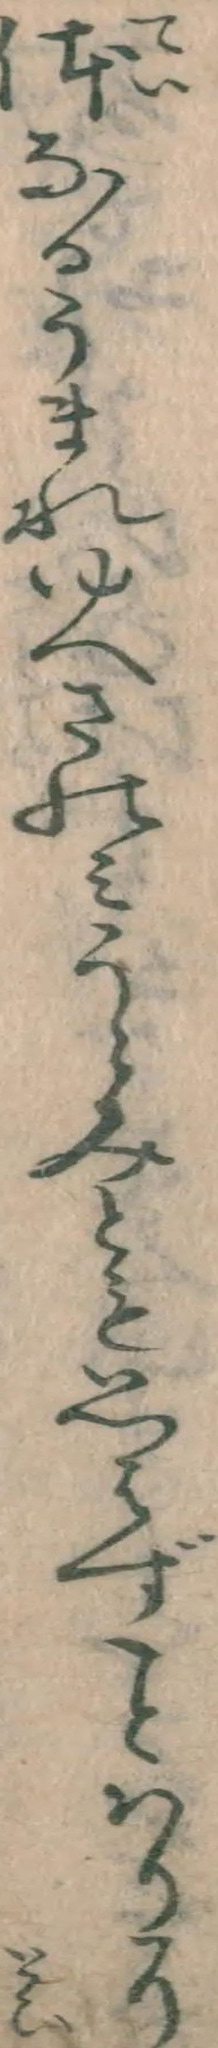体なるうまれゆへさのみうらみとも思はずことはりに
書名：怪談御伽童 5巻. [2]
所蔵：国立国会図書館 National Diet Library, JAPAN
